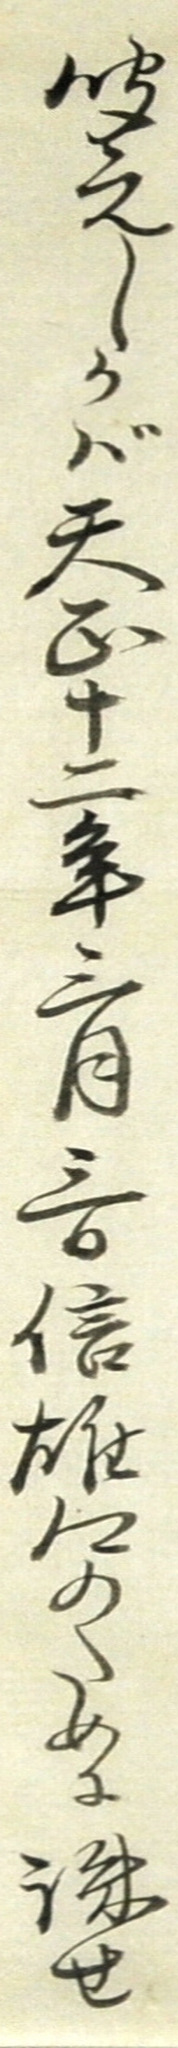聞えしかば天正十二年三月三日信雄卿のために誅せ

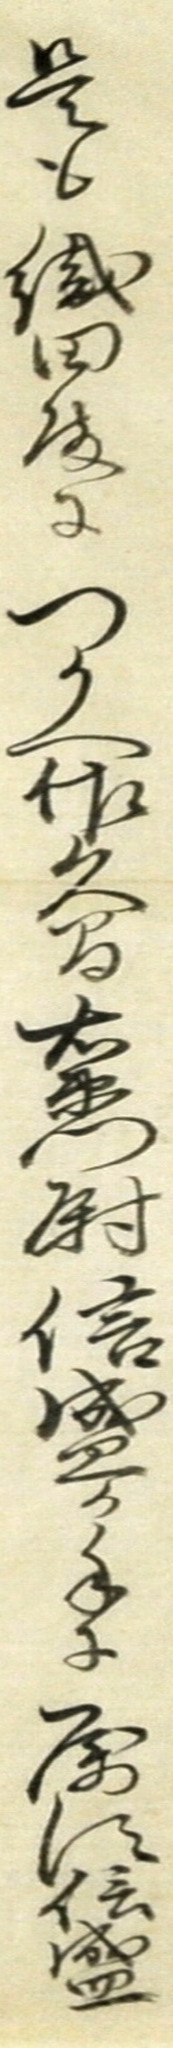是も織田殿につかへ佐久間右衛門尉信盛か手に属す信盛
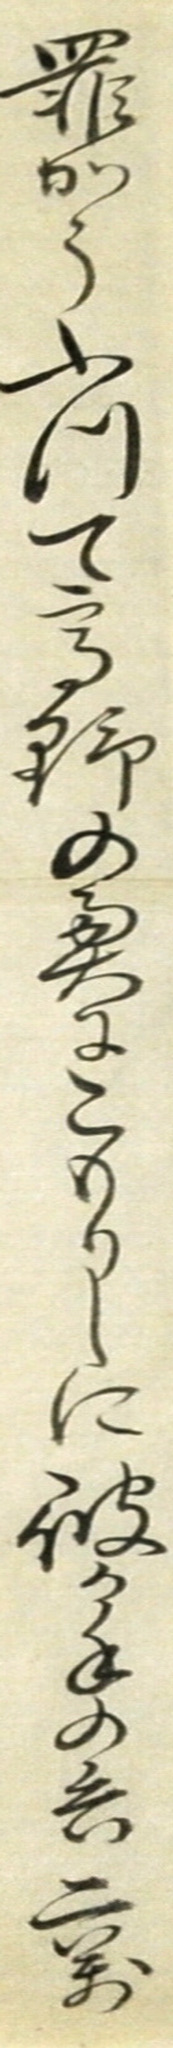罪かうふつて高野の奥にこもりしに彼か手の兵二万
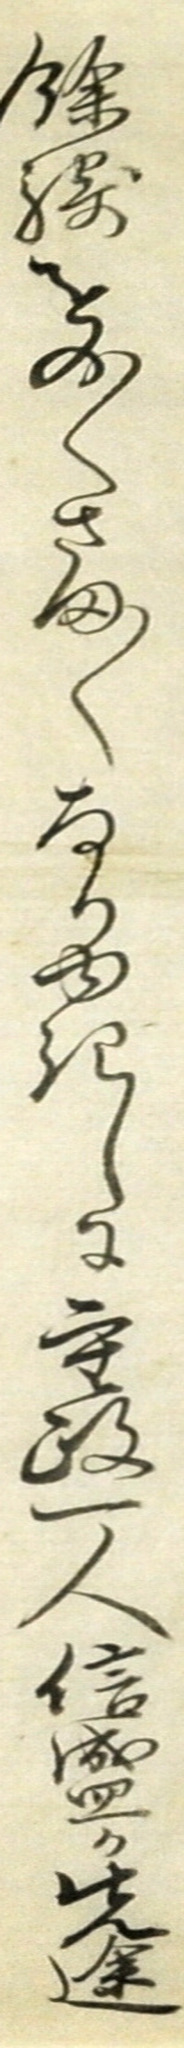余騎をの〳〵さま〳〵なりゆきしに重政一人信盛か先途
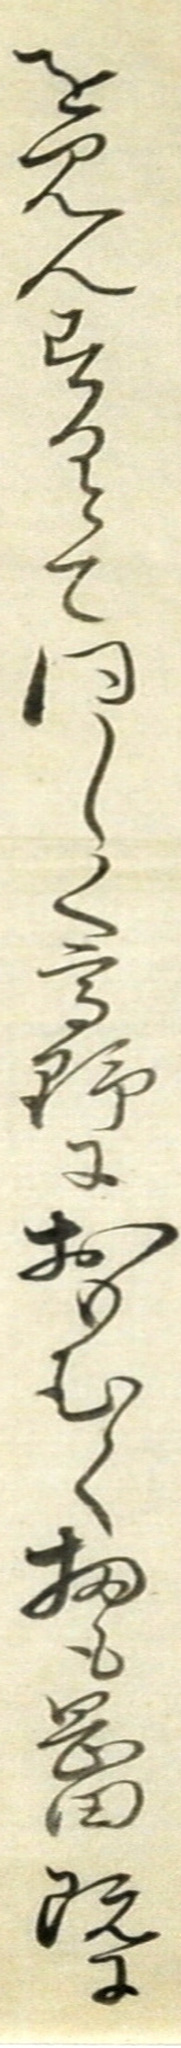を見んするとて同しく高野におもむく扨も岡田既に
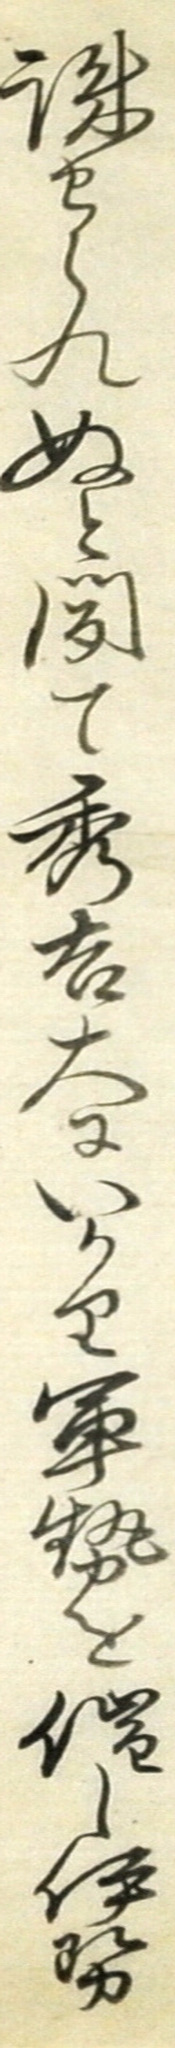誅せられぬと聞て秀吉大にいかり軍勢を催し伊勢
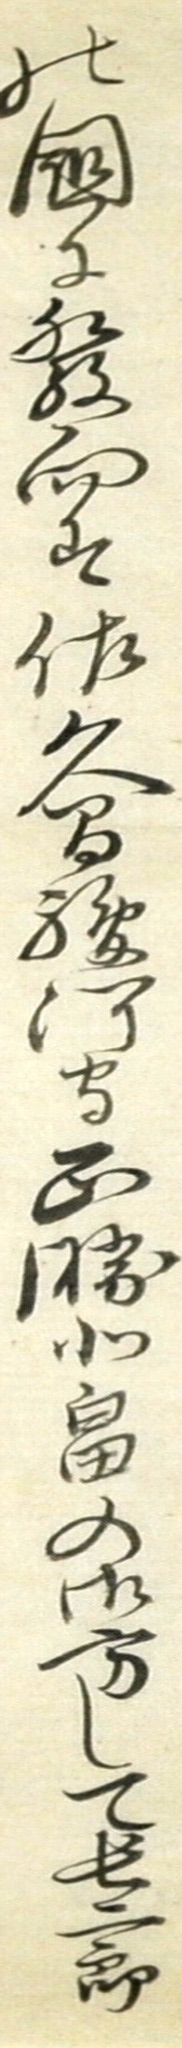の国に発向す佐久間駿河守正勝北畠の御方して長二郎
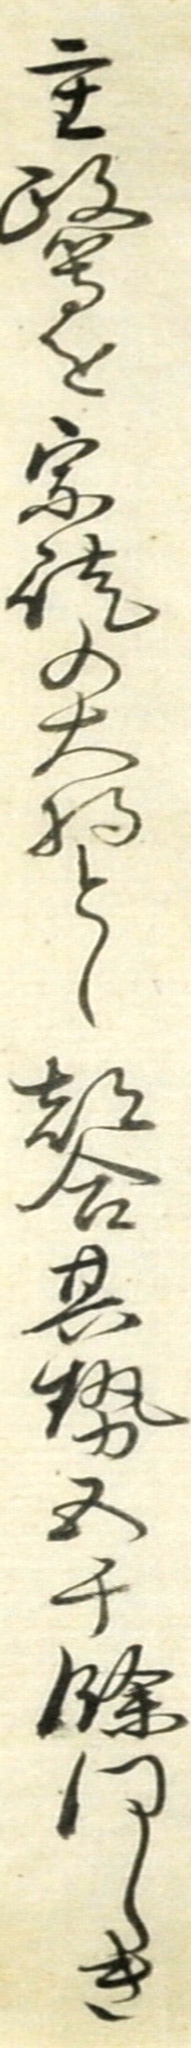重政等を宗徒の大将とし都合其勢五千余同しき
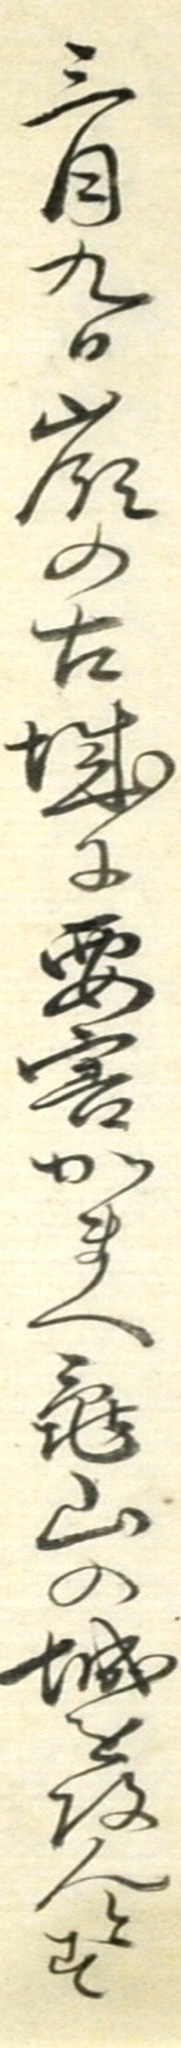三月九日嶺の古城に要害かまへ亀山の城を攻んとす
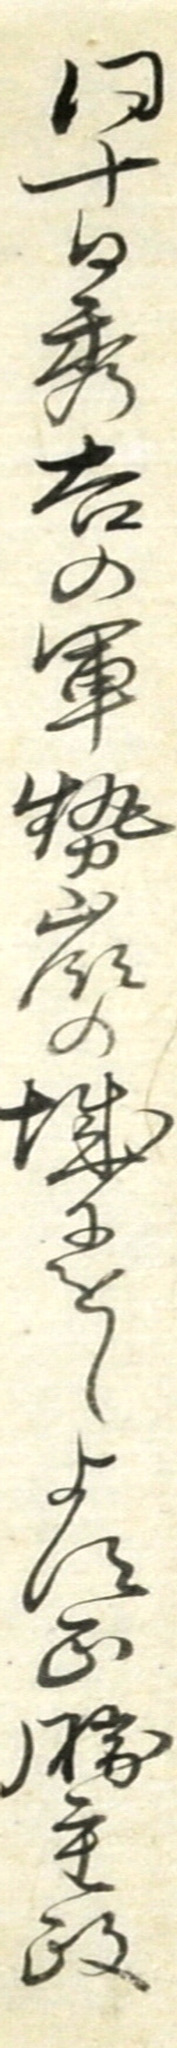同十日秀吉の軍勢嶺の城にをしよす正勝重政
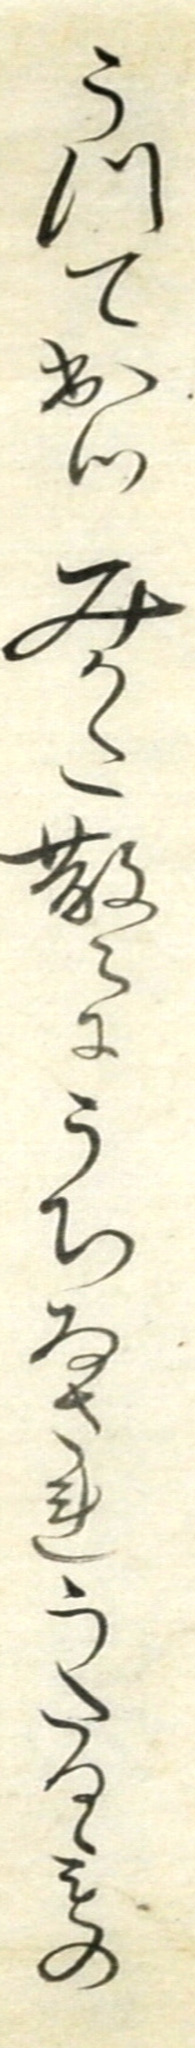うつて出つみかた散々にうちなされうたるゝもの
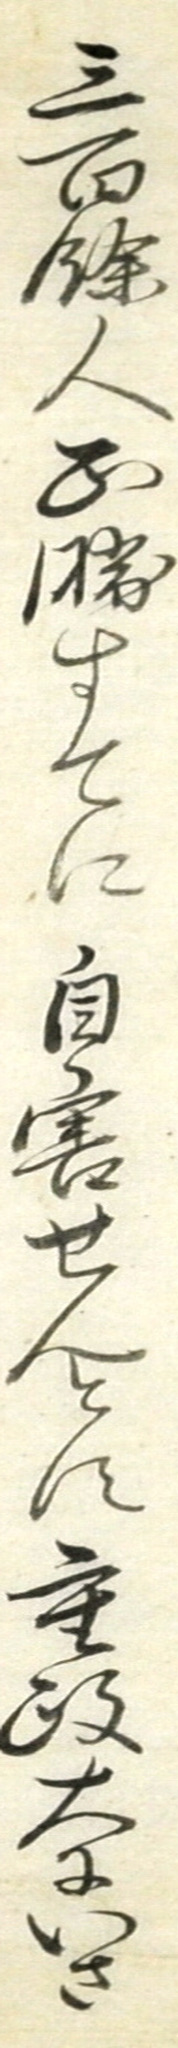三百余人正勝すてに自害せんとす重政大にいさ
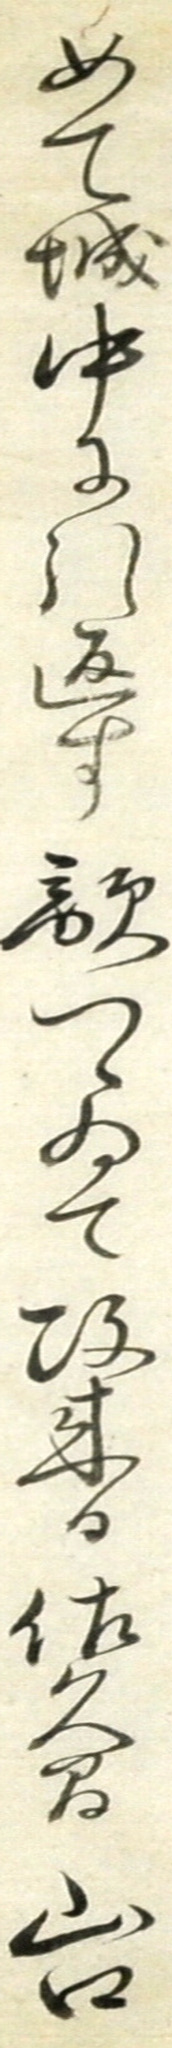めて城中に引返す敵つゝゐて攻来る佐久間山口
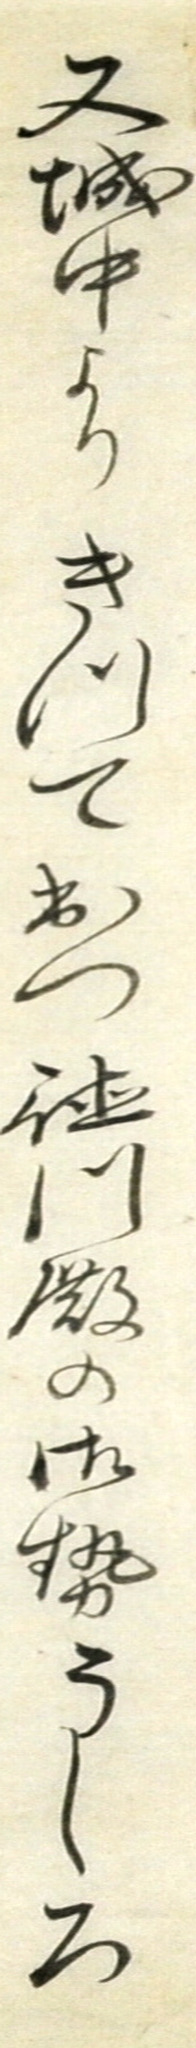又城中よりきつて出つ徳川殿の御勢うしろ
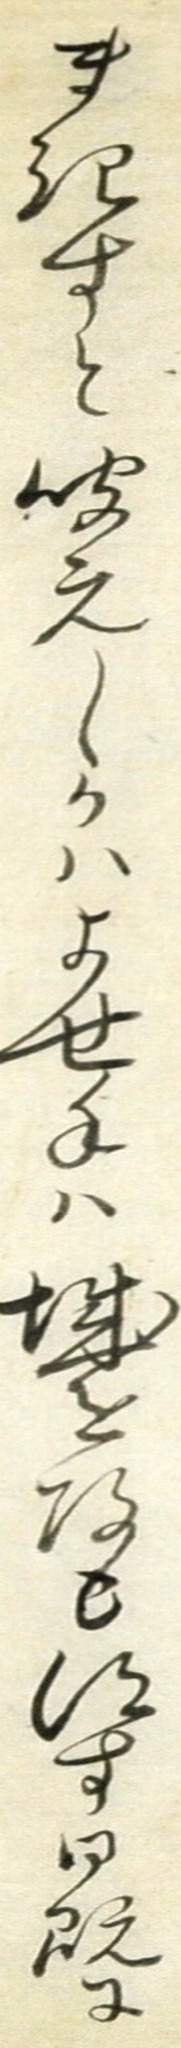まきすと聞えしかはよせ手は城を攻も得す日既に
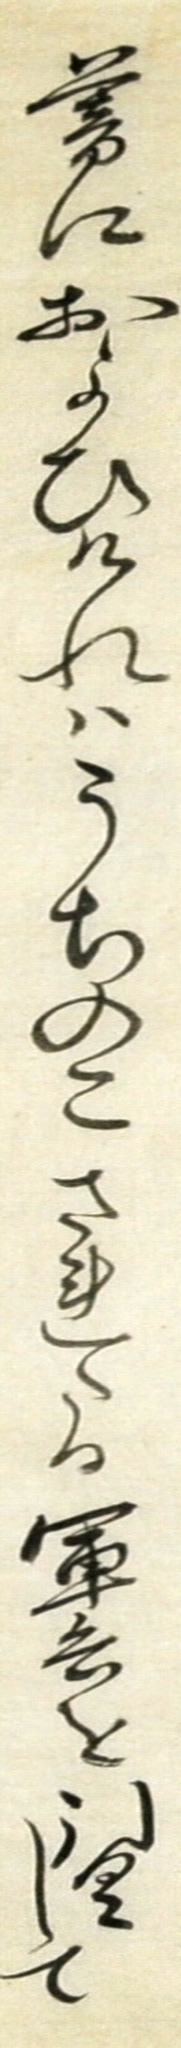暮におよひけれはうちのこされたる軍兵を引具して
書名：藩翰譜（六）
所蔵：伊那市立高遠町図書館・合同会社AMANE
